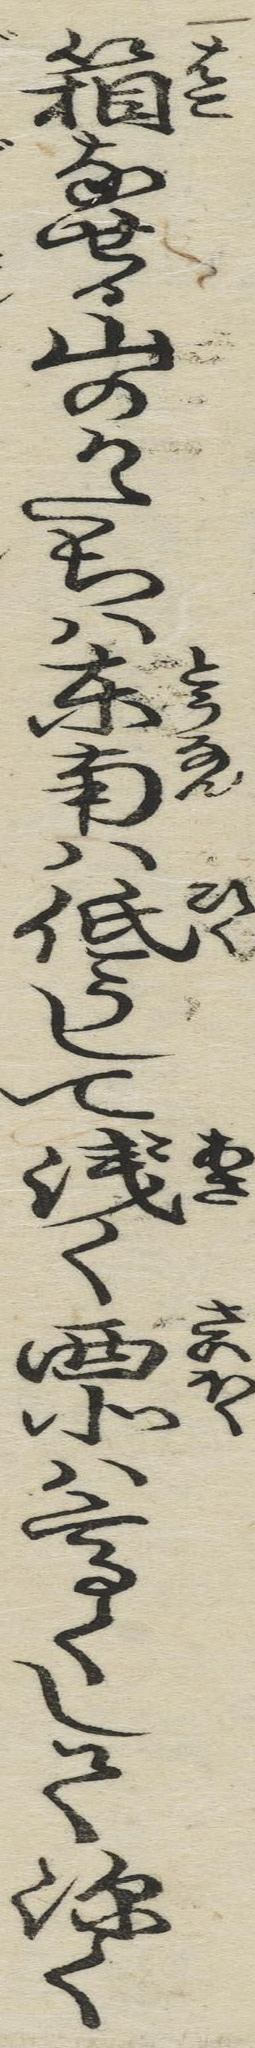箱なせる山のかたちは東南）は低うして西北は高くして深く
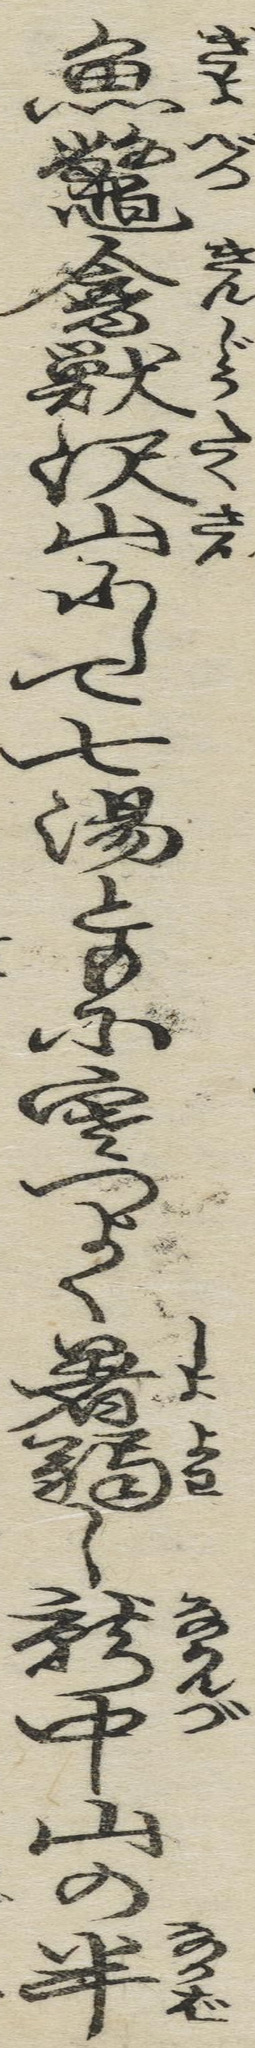魚鼈禽獣沢山にして七湯ともに寒つよく暑弱し就中山の半
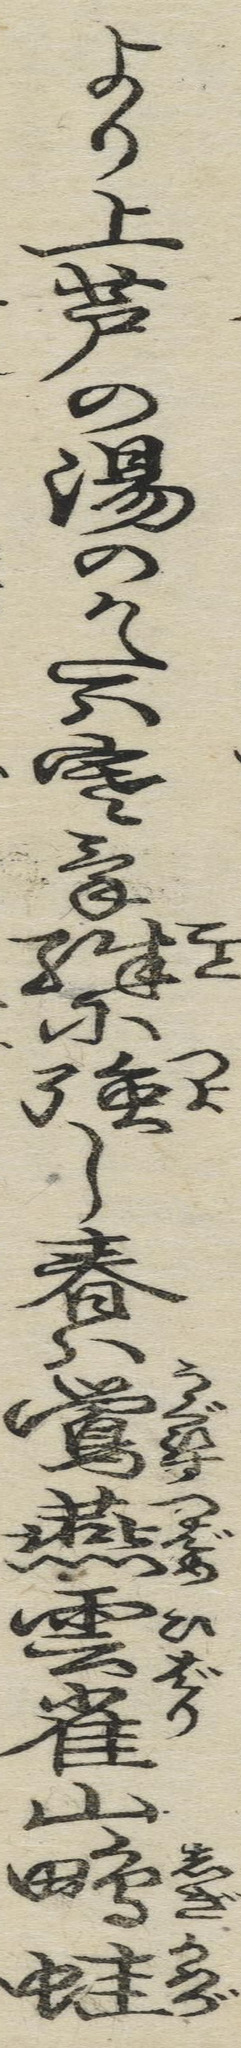より上芦の湯のかたは寒気殊に強し春は鴬燕雲雀山鴫蛙
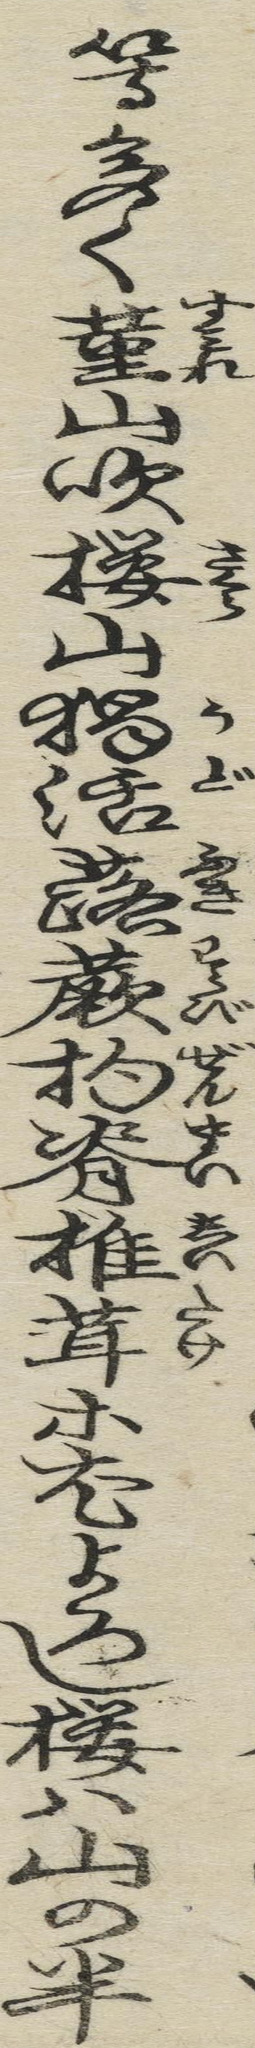等多く菫山吹櫻山独活蕗蕨杓脊椎茸等尤よろし櫻は山の半
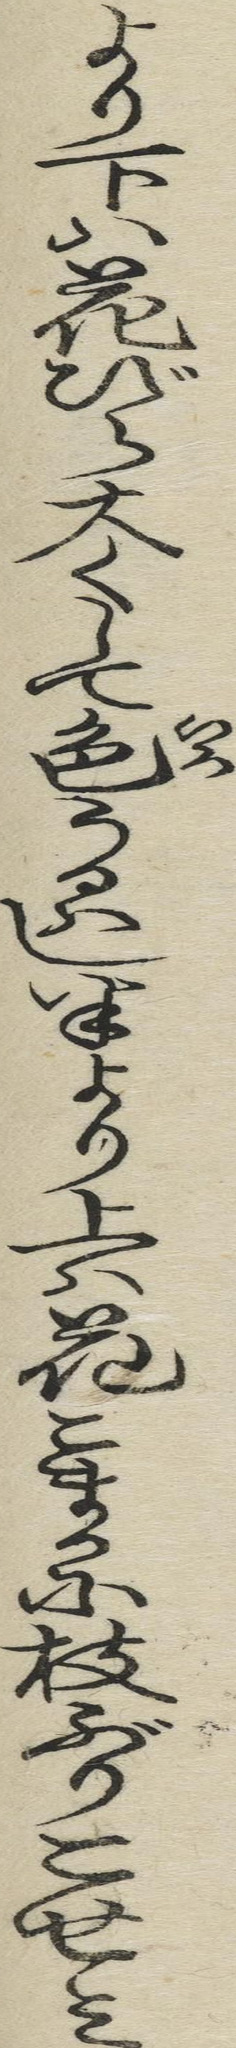より下は花びら大くして色うるはし半より上は花こまかに枝ぶりこせみ
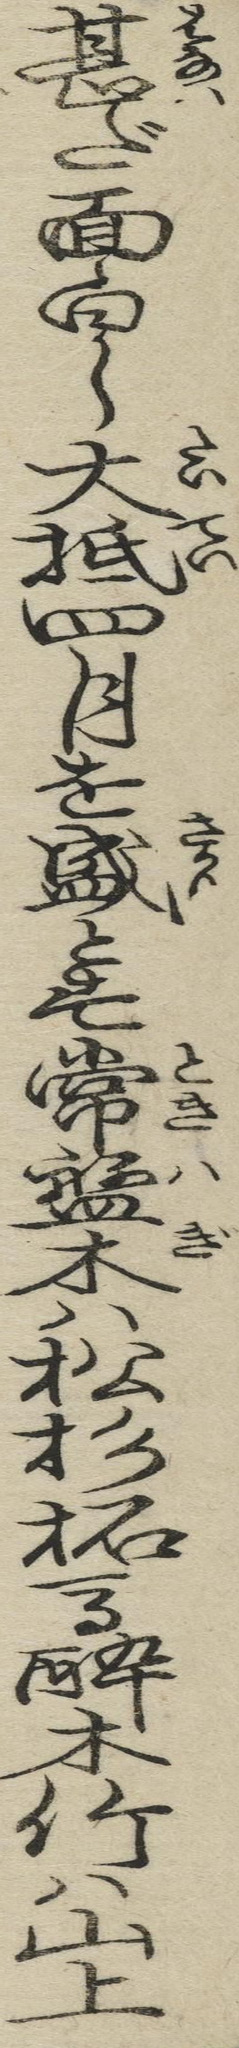甚だ面白く大抵四月を盛とす常磐木は松杉柘等酔木竹は山上
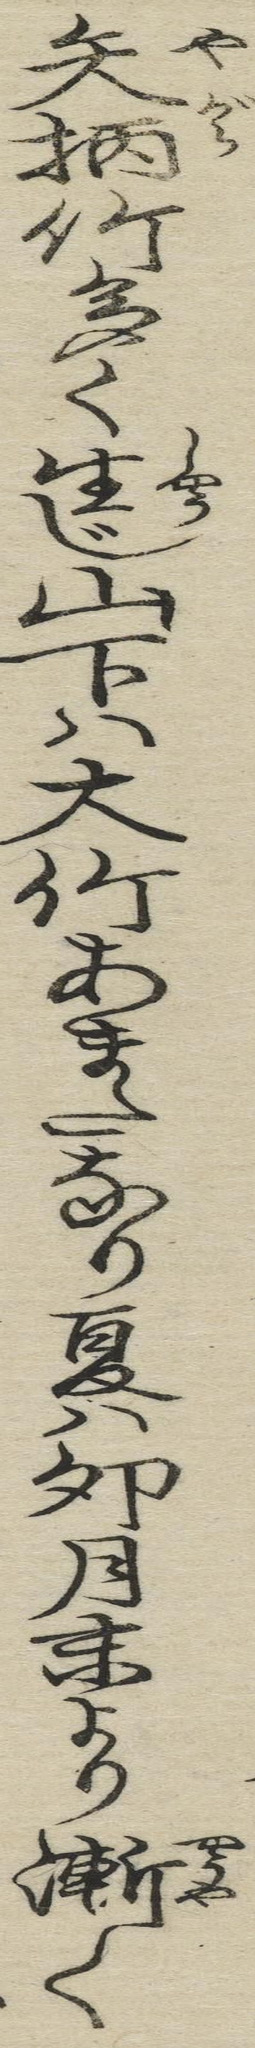矢柄竹多く生じ山下は大竹あまたなり夏は卯月末より漸く
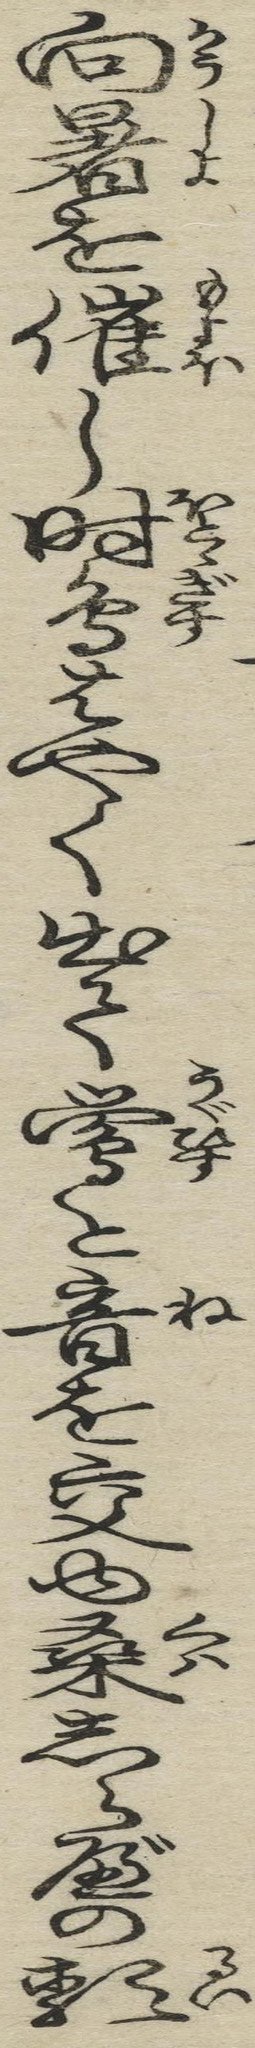向暑を催し時鳥はやく出て鴬と音を交ゆ桑しらべの類
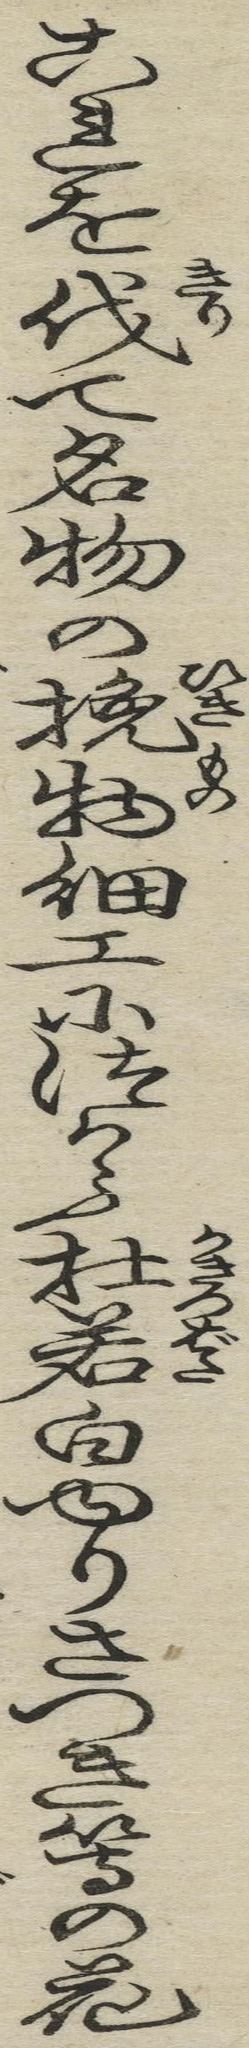これを伐て名物の挽物細工につかふ杜若白ゆりさつき等の花
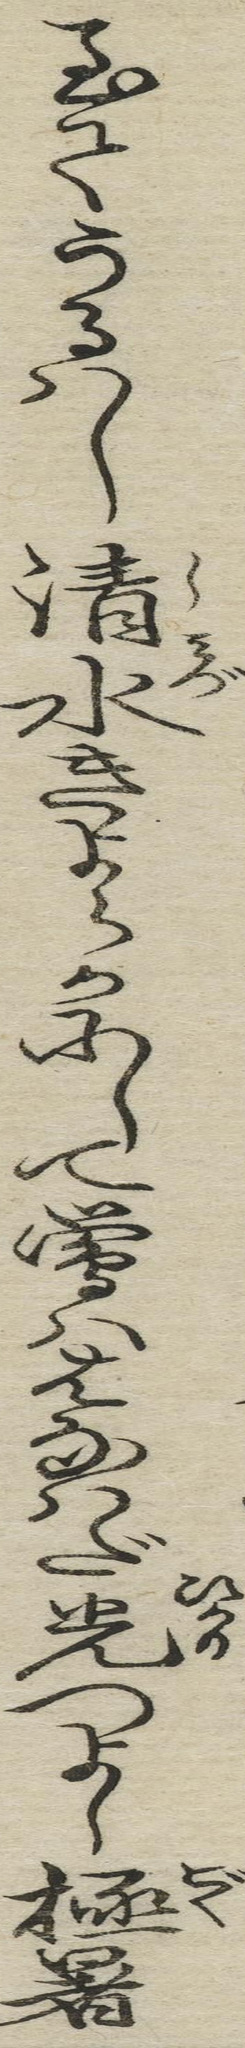至てうるはし清水きよらかにして鴬はなはだ光つよし極暑
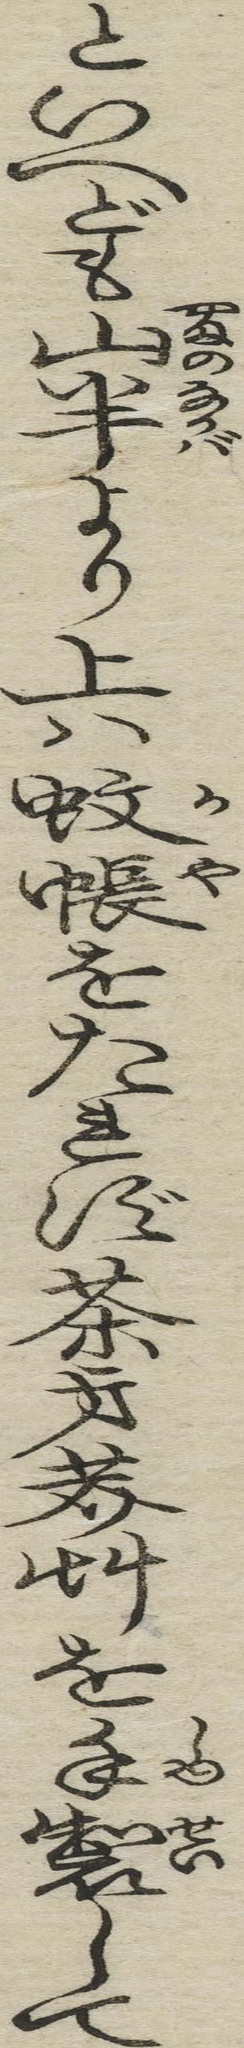といへども山半より上は蚊帳をたれず茶艸を手製して
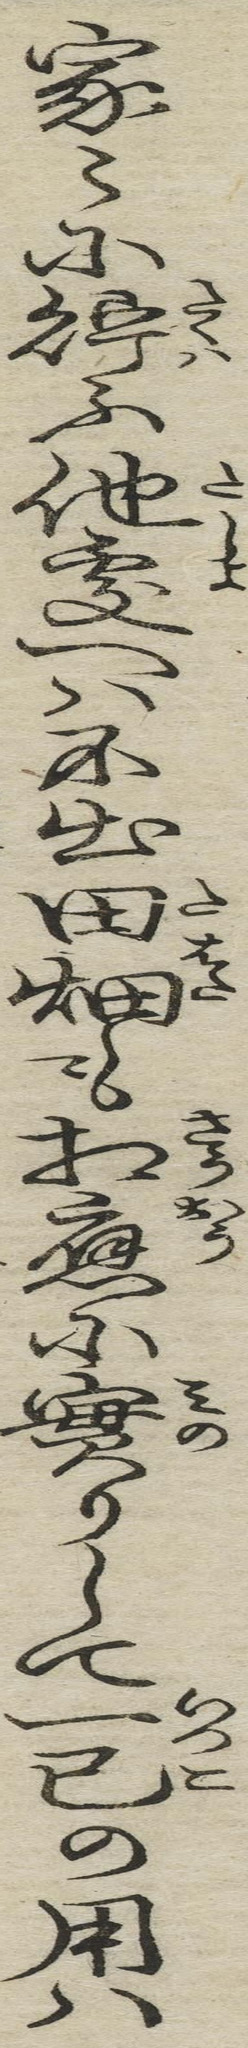家々に貯ふ他處へは不出田畑も相應に實りして一己の用は
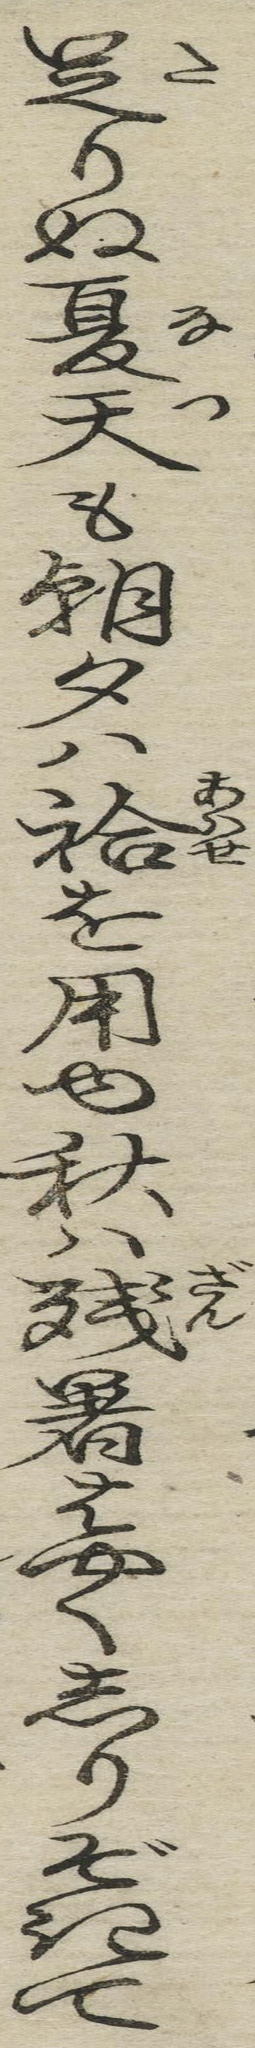足りぬ夏天も朝夕は袷を用ゆ秋は残暑はやくしりぞきて
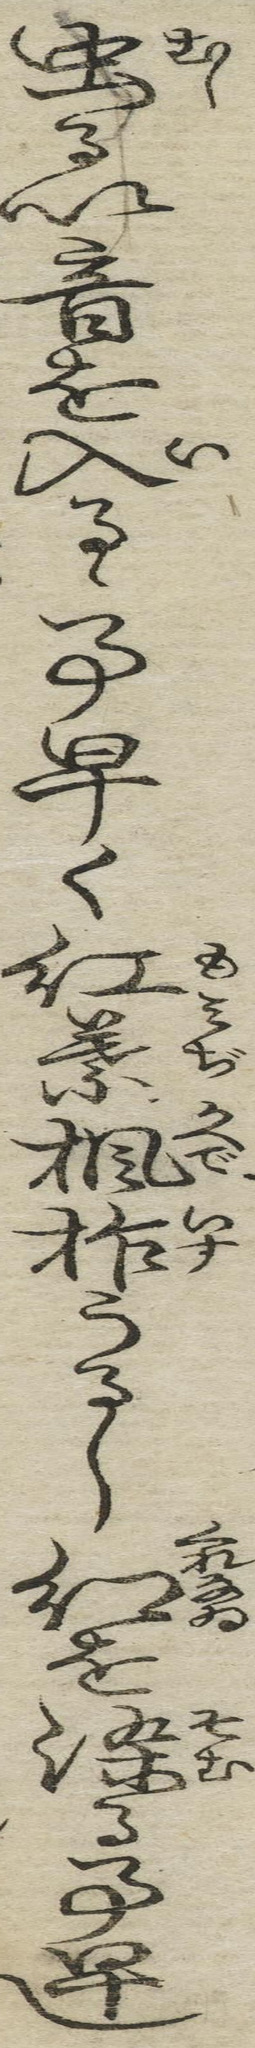虫るひ音を入る事早く紅葉楓柞うるし紅を染る事早し
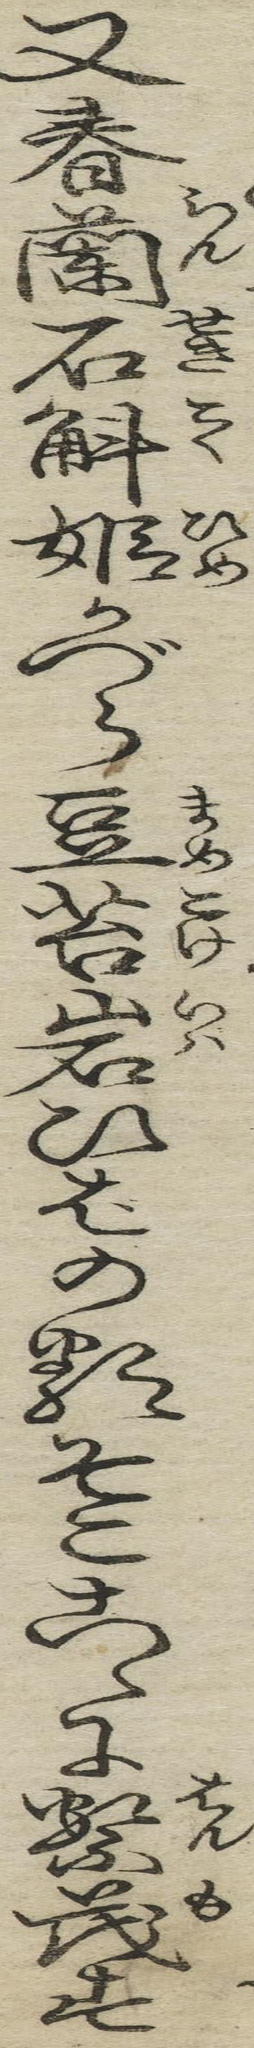又春蘭石斛姫かづら豆苔岩ひはの類そここゝに繁茂す
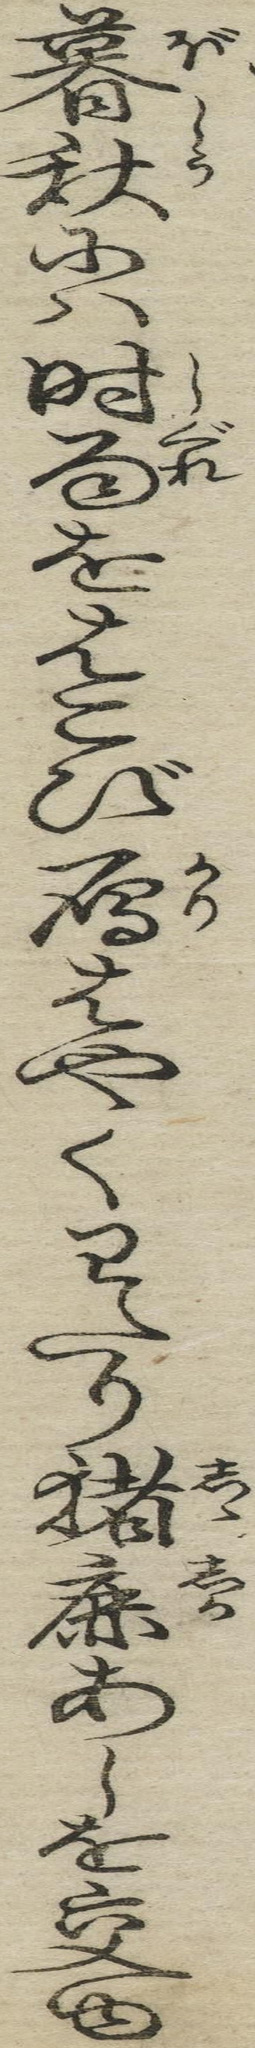暮秋には時雨をはこび雁はやくわたり猪鹿あしを交ゆ
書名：箱根七湯　温泉圖會　全
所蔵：東京大学地震研究所図書室 Earthquake Research Institute Library, The University of Tokyo, JAPAN
